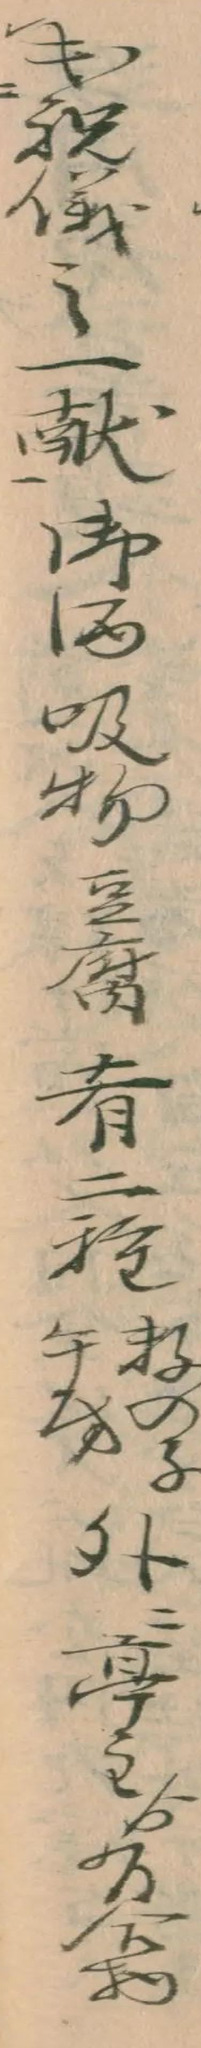出祝儀之一献御酒吸物豆腐肴二種数の子午房外ニ亭主ゟ有合物
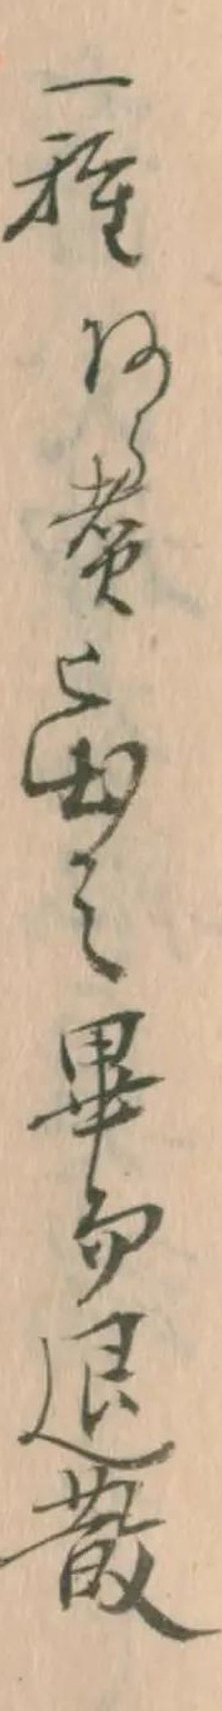一種あら煮被出之畢而退散
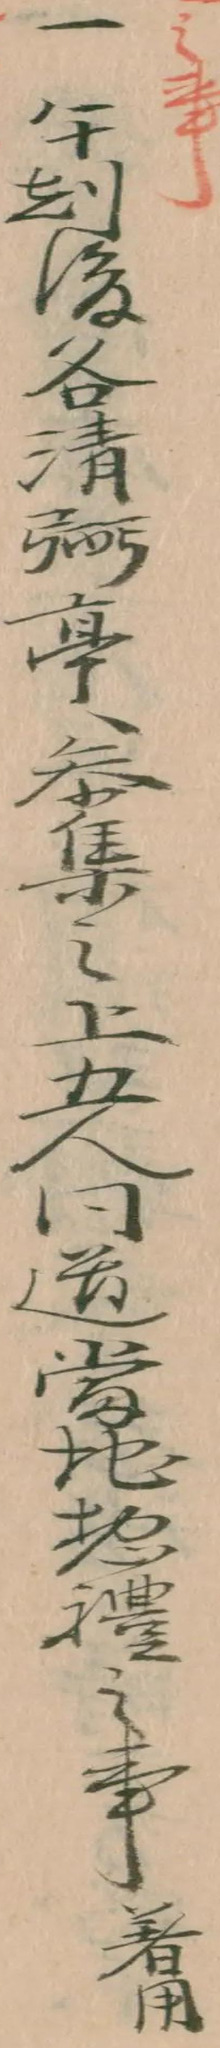一午刻後各清弼亭へ参集之上五人同道當地惣禮之事着用
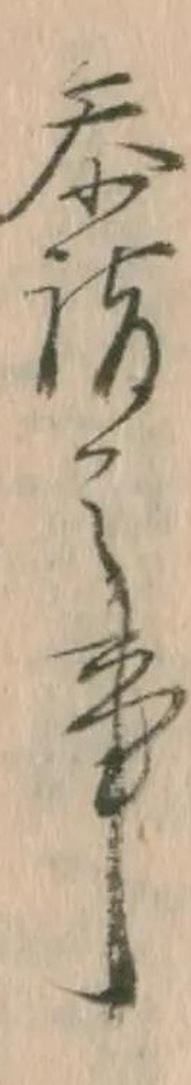参詣之事
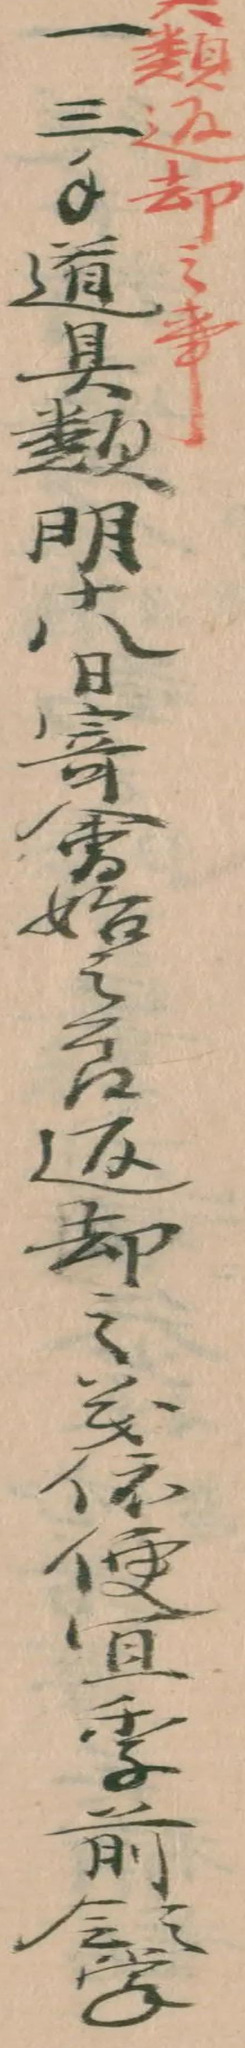一三手道具類明十八日寄會始之節返却之義依便宜季前領掌
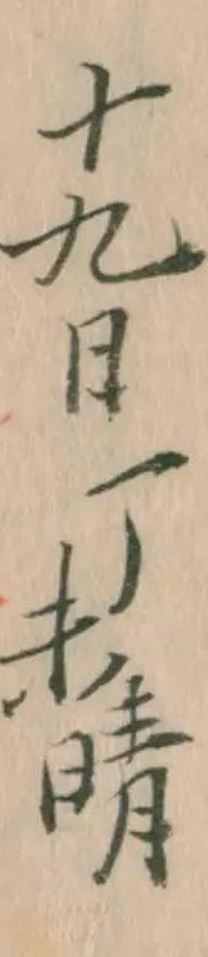十九日丁未晴
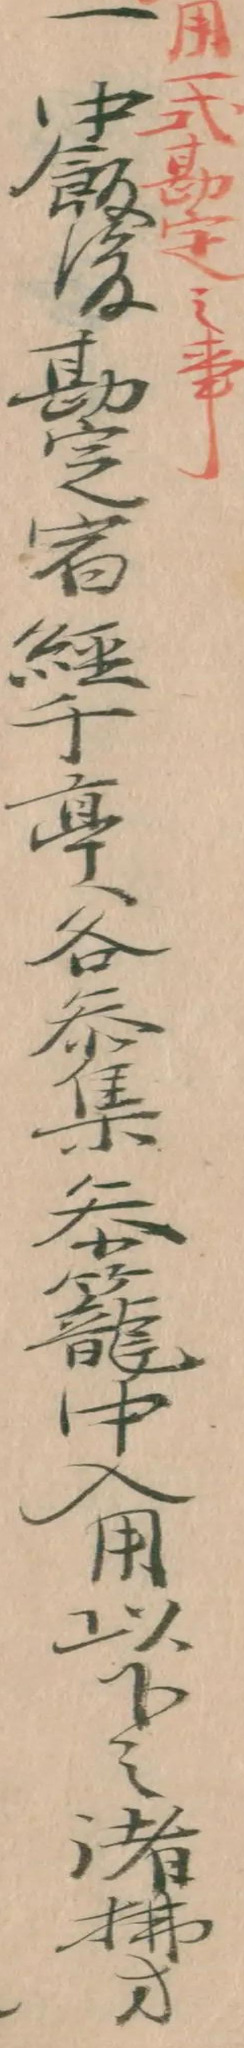一中飯後勘定宿経千亭ヘ各参集参籠中入用以下之諸払方
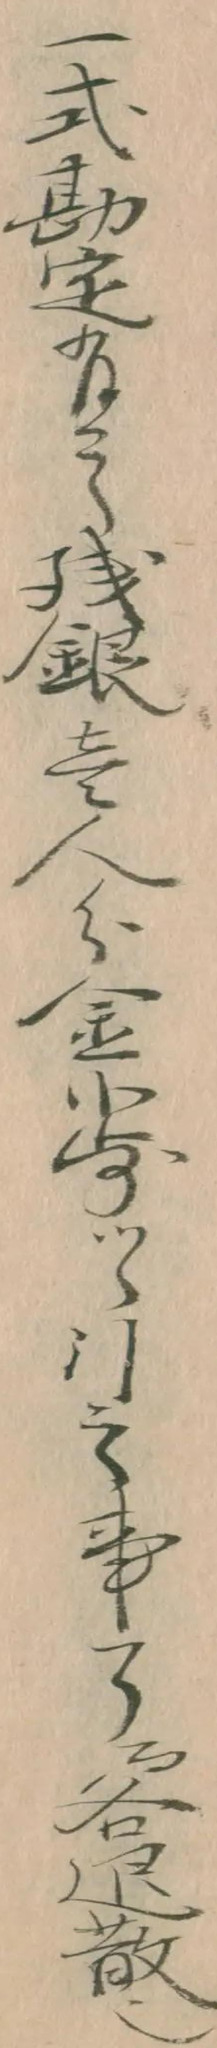一式勘定有之残銀壱人分金小歩ツヽ引之事了而各退散也
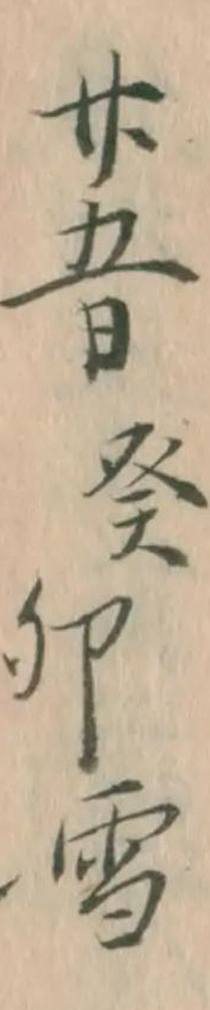廿五日癸申雪

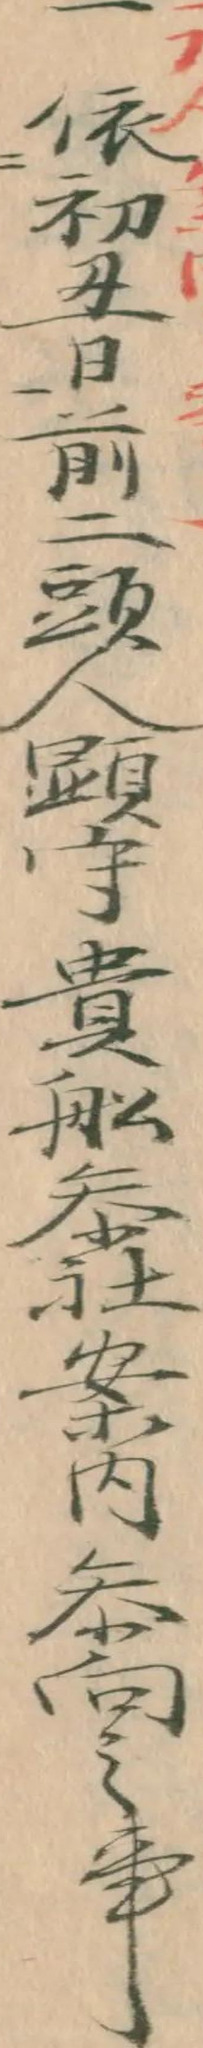一依初丑日前二頭人顕守貴舩参社案内参向之事
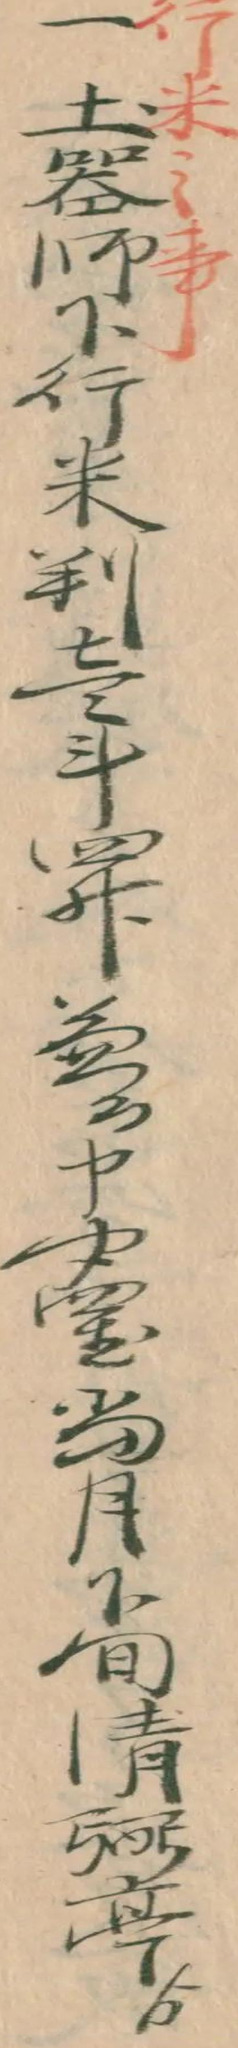一土器師下行米判壱斗四升兼而申聞置當月下旬清弼亭ゟ
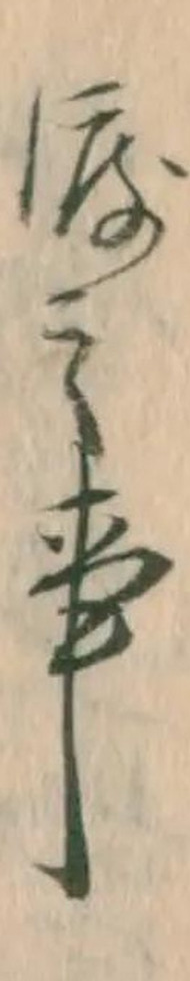渡之事
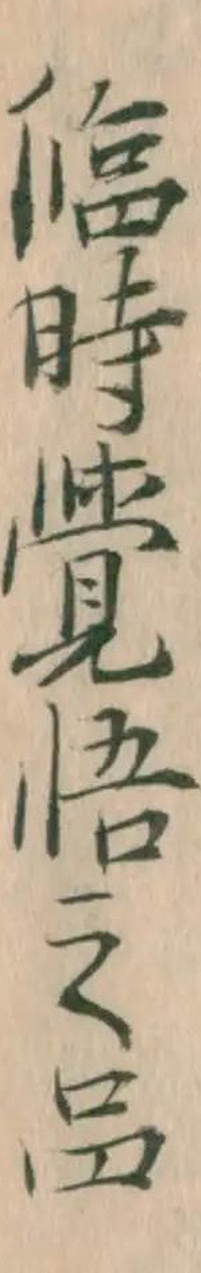臨時覚悟之品
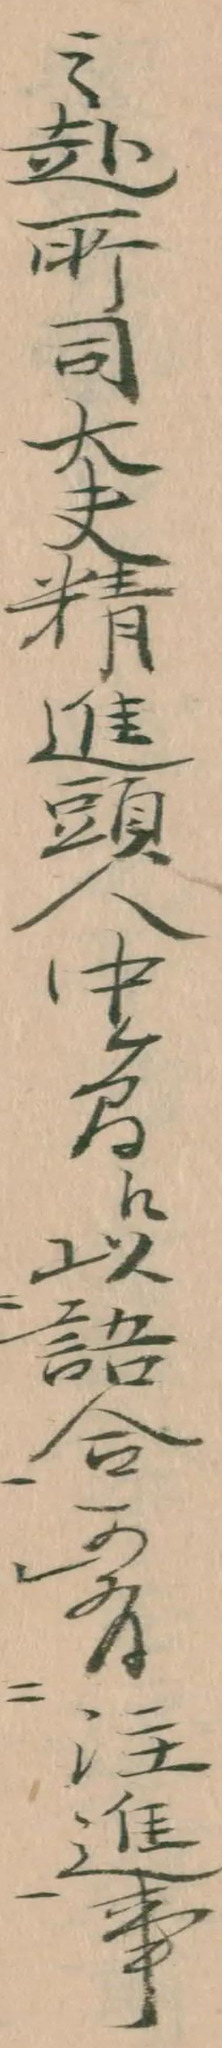之赴所司大夫精進頭人中ケ間え以語合可有注進事
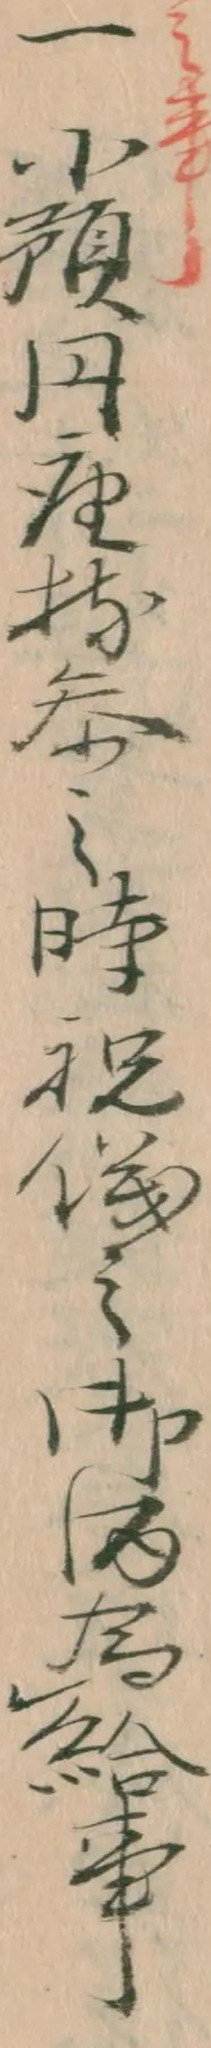一小預円座持参之時祝儀之御酒為給事
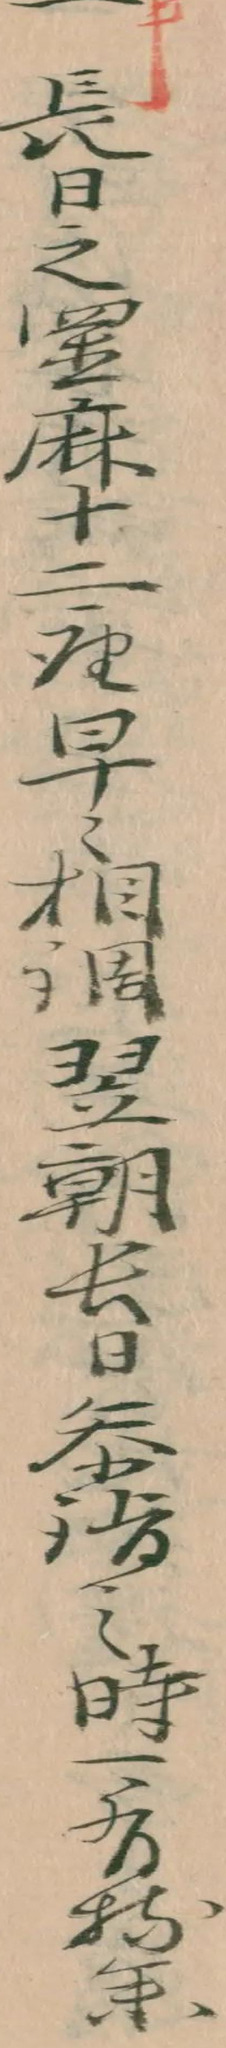一長日之置麻十二座早〻相調翌朝長日参詣之時一持参
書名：賀茂社記録. 第74冊
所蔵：国立国会図書館 National Diet Library, JAPAN
